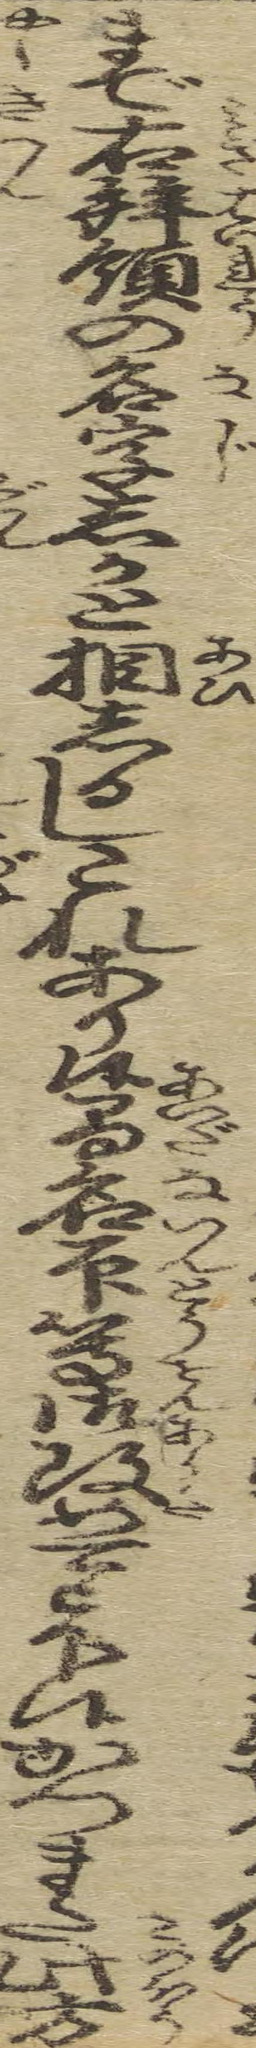まで右拝領の名字しかと相しるしこれあり候間名印等御改め可被下候かつまた此方
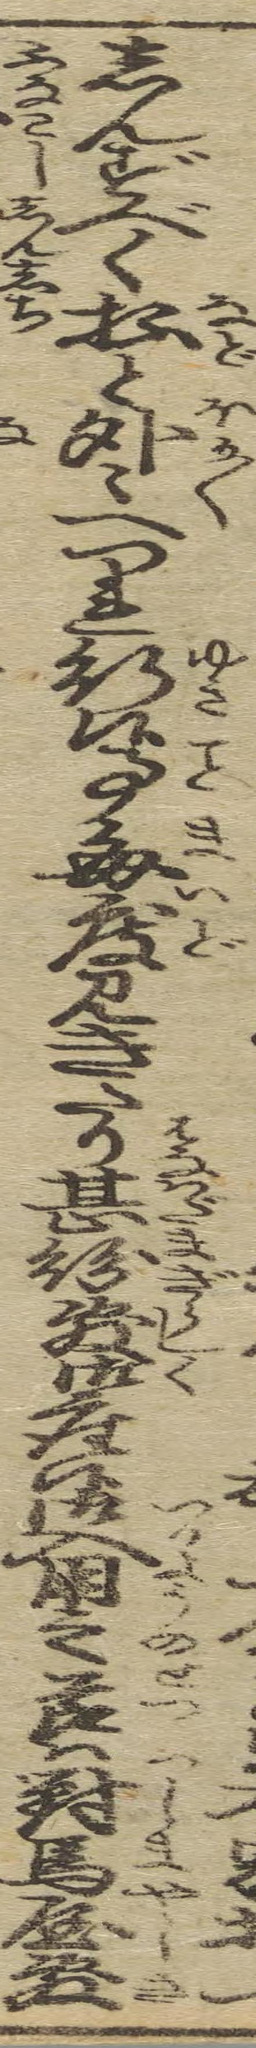しんずべく抔と外々へつれ行候事毎度見きたり甚紛敷御座候御入用之節は対馬屋敷
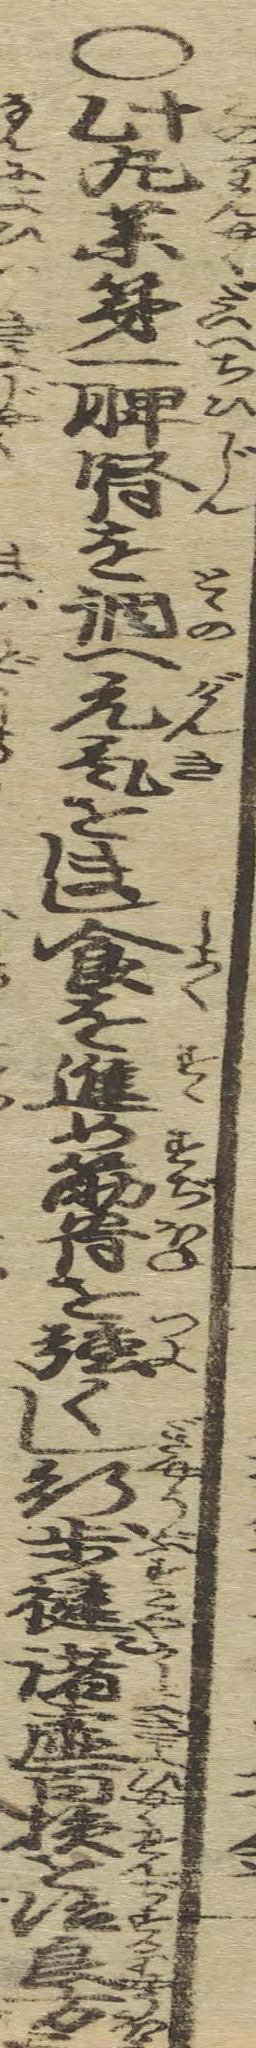○此丸薬第一脾腎を調へ元気をまし食を進め筋骨を強くし行歩健ニ諸虚百損を治良法也
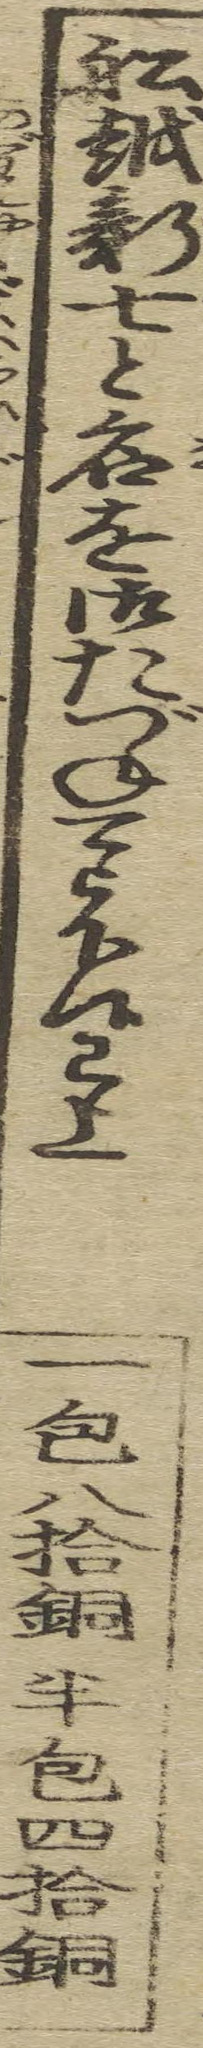船越新七と名を御たづね可被下候已上一包八住八拾銅半包四拾銅
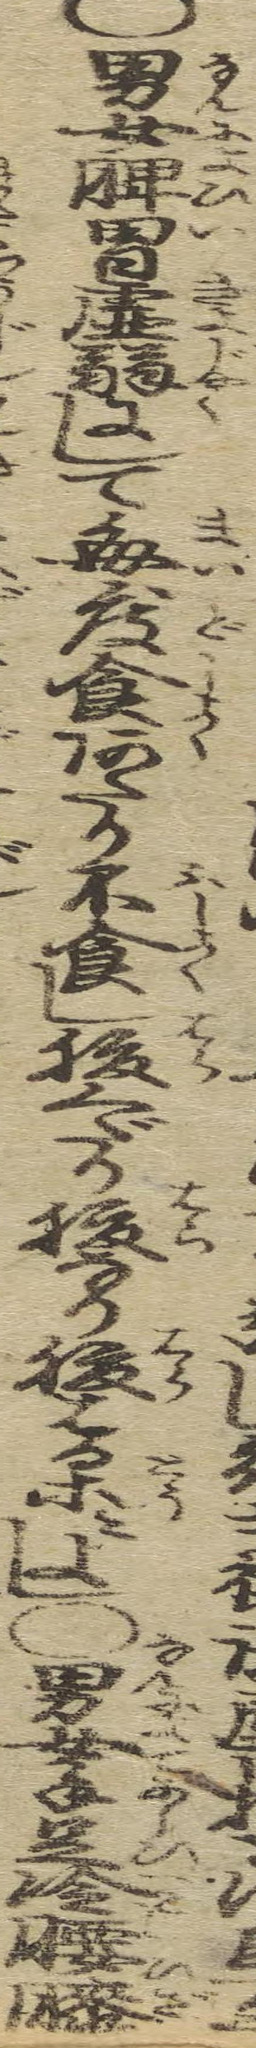○男女脾胃虚弱にして毎度食あたり不食し腹くだり腹なり腹はる等ニよし○男女手足冷腰膝
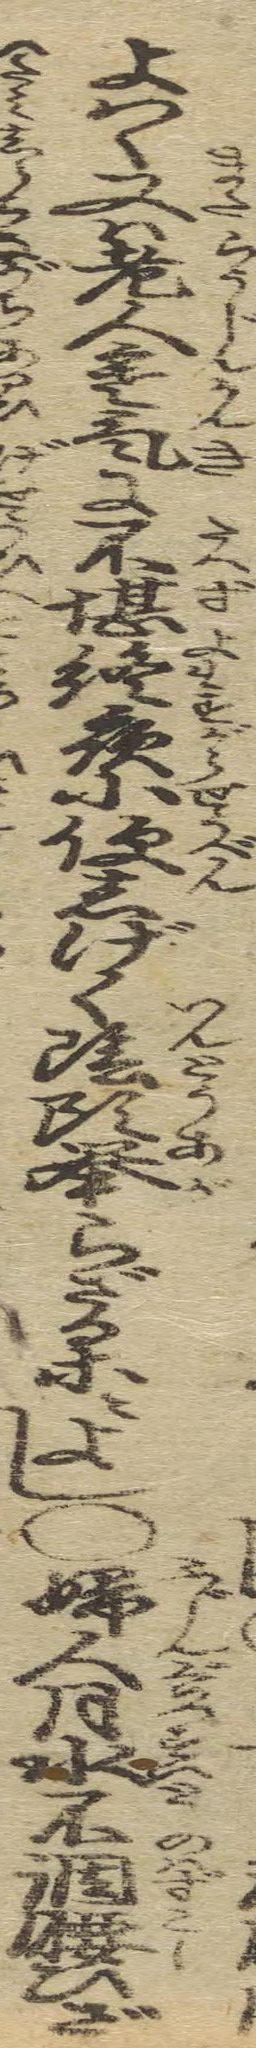よはく又は老人寒気に不堪終夜小便しげく陰頭挙らざる等ニよし○婦人月水不調腰ひざ
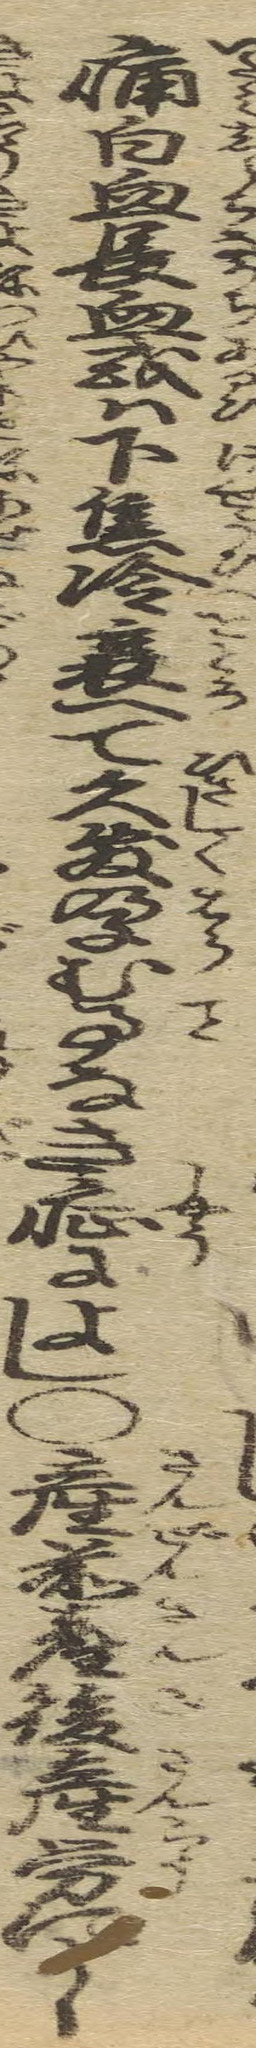痛白血長血或は下焦冷衰へて久敷孕む事なき症によし○産前産後産労によし
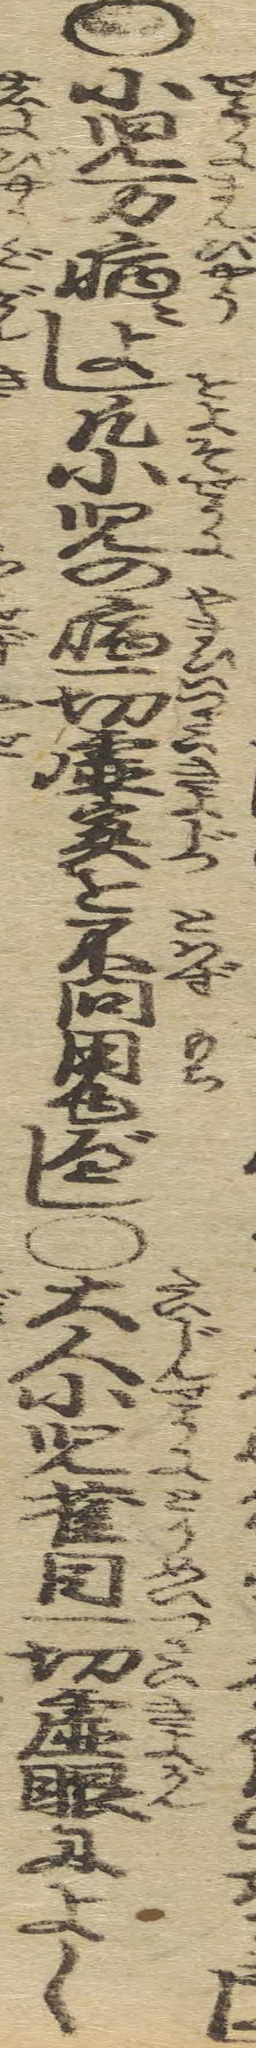○小児万病ニよし凡小児の病一切虚実を不問用ゆべし○大人小児雀目一切虚眼によし
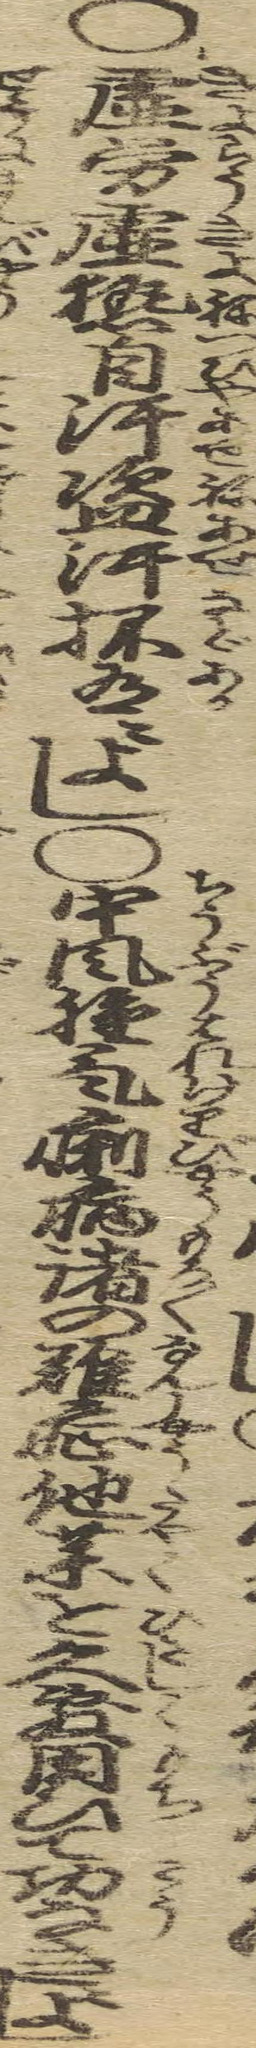○虚労虚熱自汗盗汗抔有ニよし○中風腫気痢病諸の難症他薬を久敷用ひて功なきよし
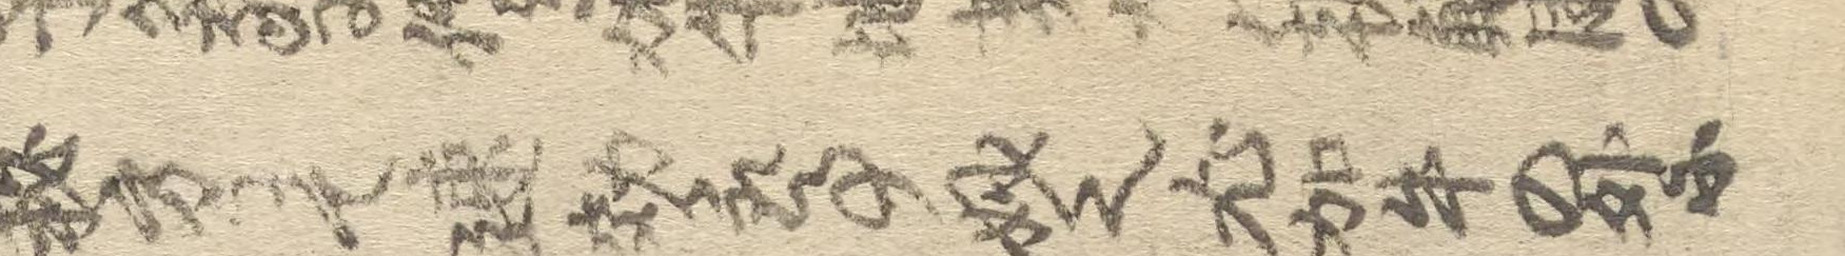秘方にて速攻取事妙也尤加牛の外に
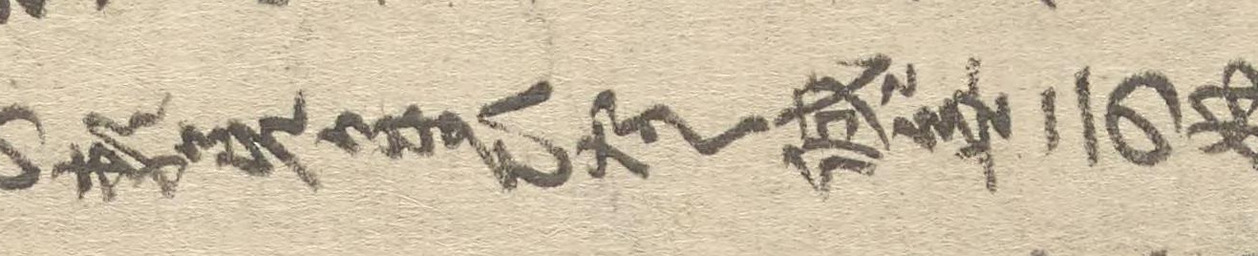の類差かまひなく誠ニ無二の妙剤也
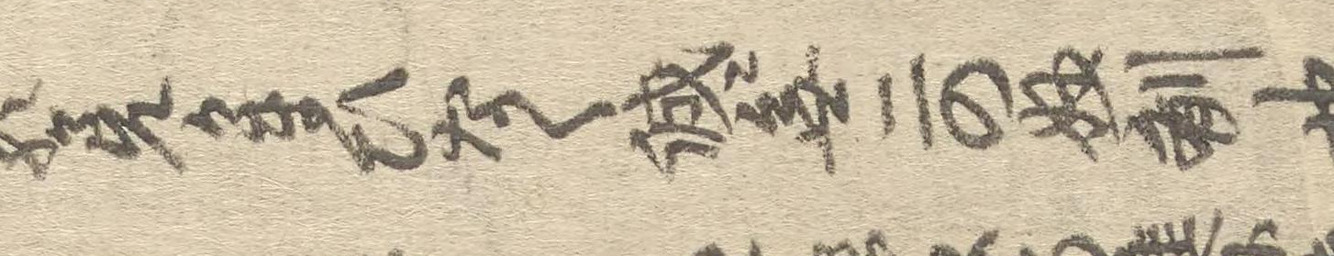の類差かまひなく誠ニ無二の妙剤也
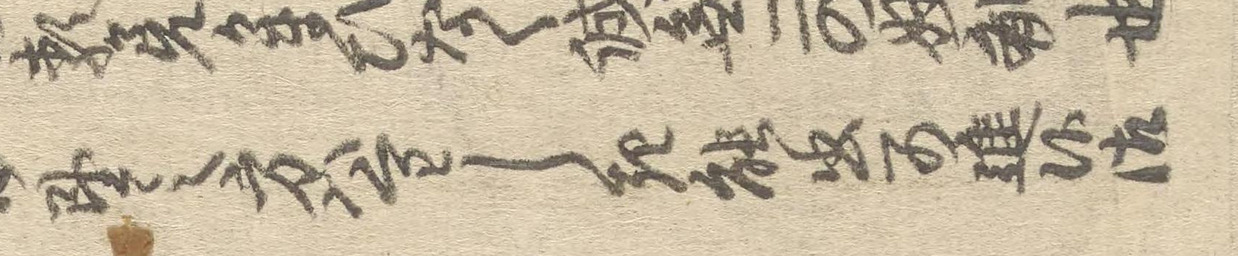御望之方はくわしき能書可進候御
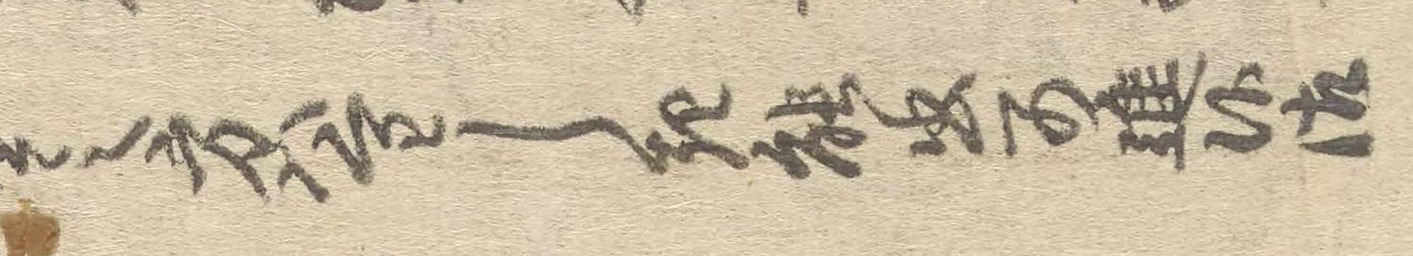御望之方はくわしき能書可進候御
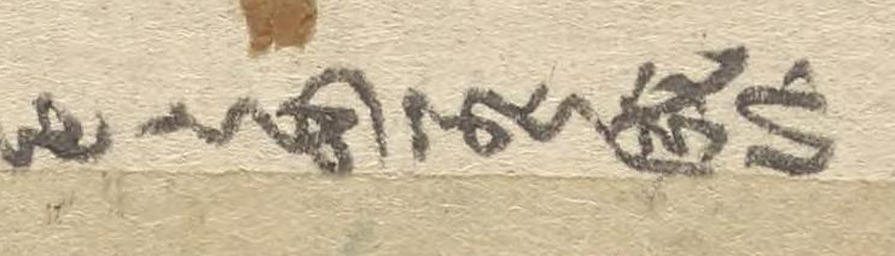もとめ可被成候
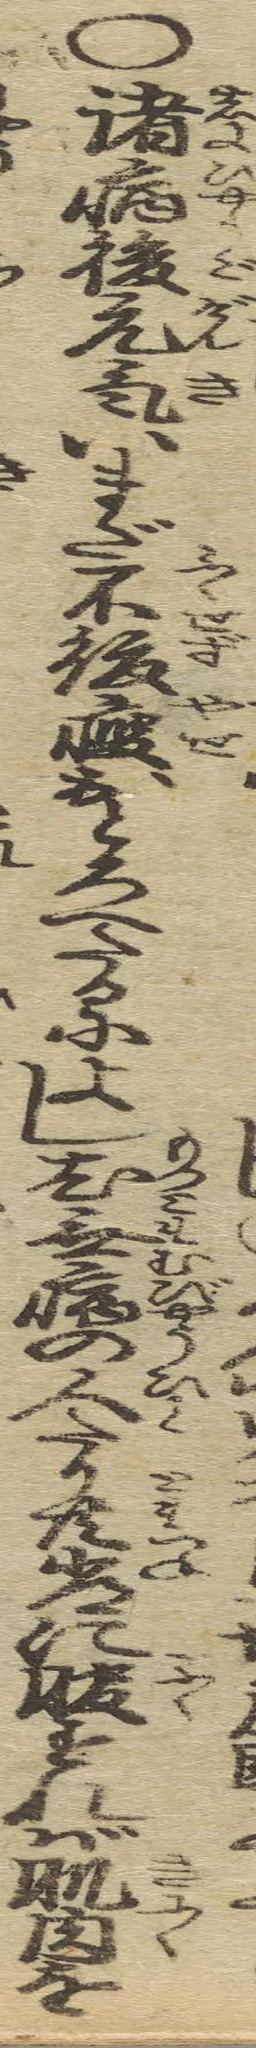○諸病後元気いまだ不服痩おとろへたるによし尤無病の人たり共常に服すれば肌肉を
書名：浪華薬種問屋能書張交帖. 二
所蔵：国立国会図書館 National Diet Library, JAPAN
